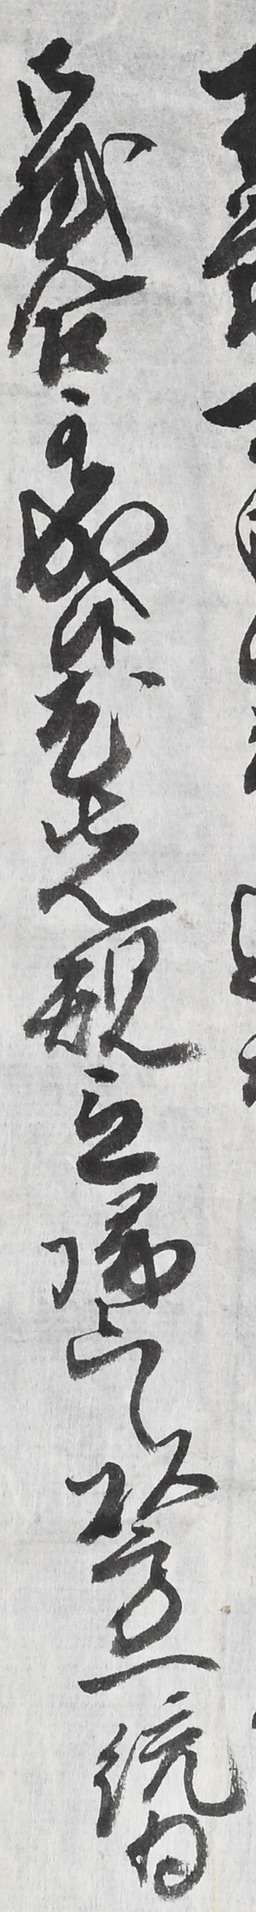御掛合可成候尤先規立帰候ハヽ双方一統為
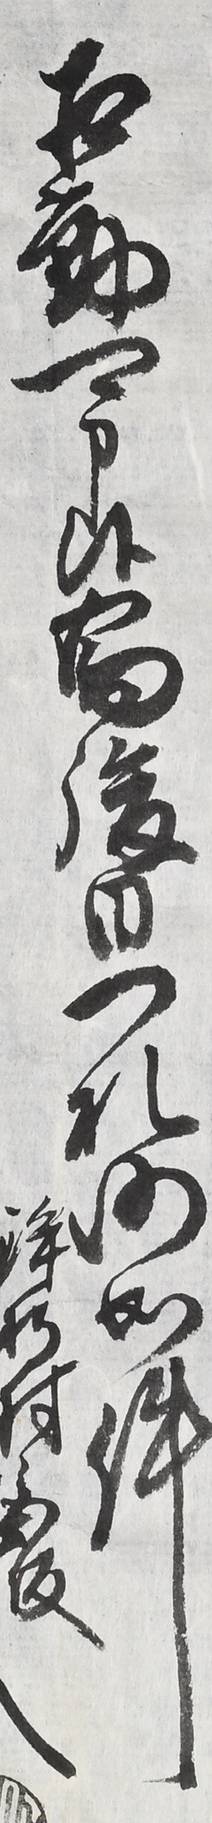相勤可申候為後日一札仍如件
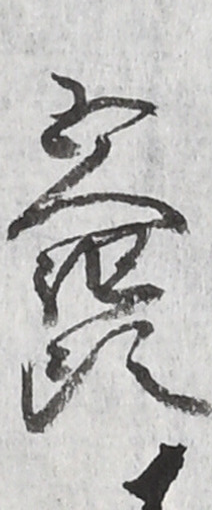五人組頭
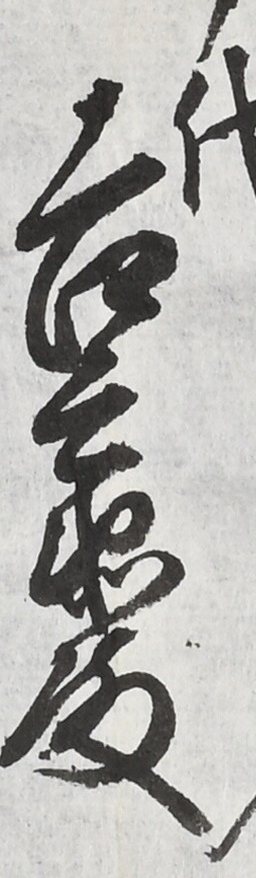吉兵衛殿
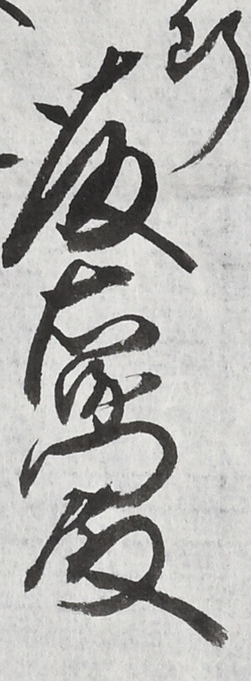藤右衛門殿
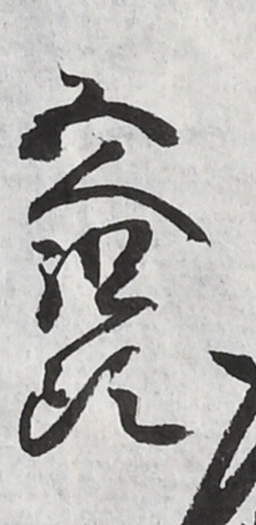五人組頭
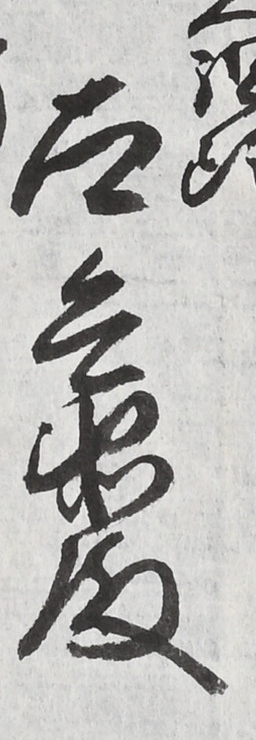吉兵衛殿
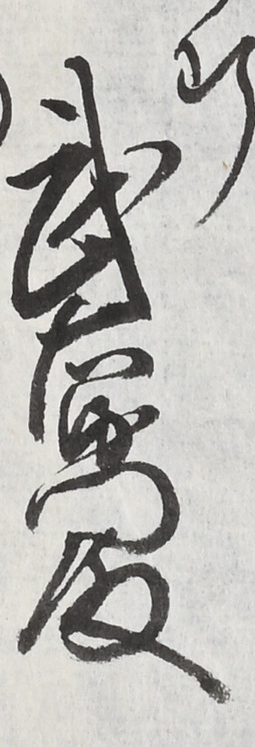武右衛門殿
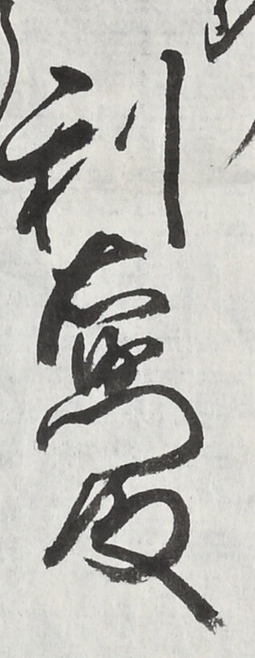利右衛門殿
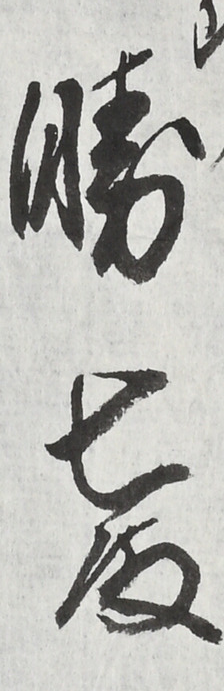勝七殿
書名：書違一札之事
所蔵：伊那市立高遠町図書館・合同会社AMANE
